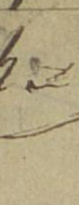p. 6
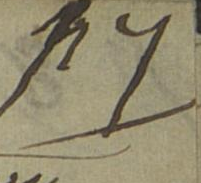p 7
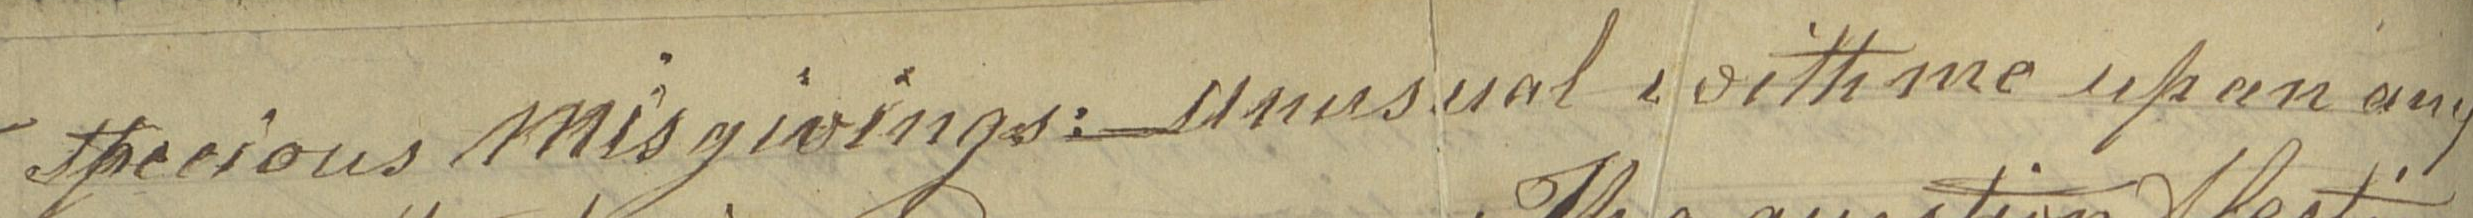Specious Misgivings Unusual with me upon any
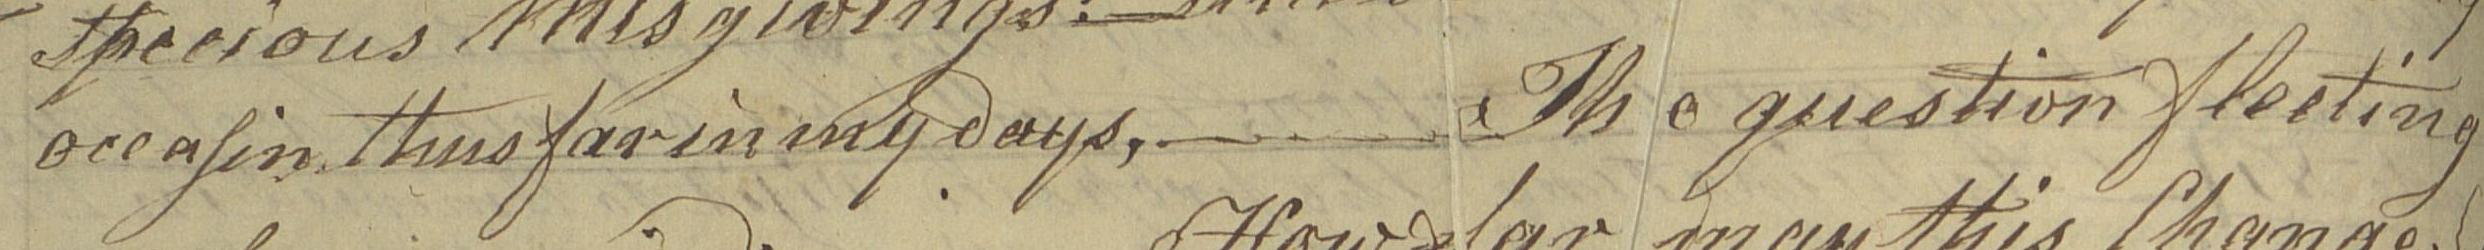occasin thus far in my days, The question floating
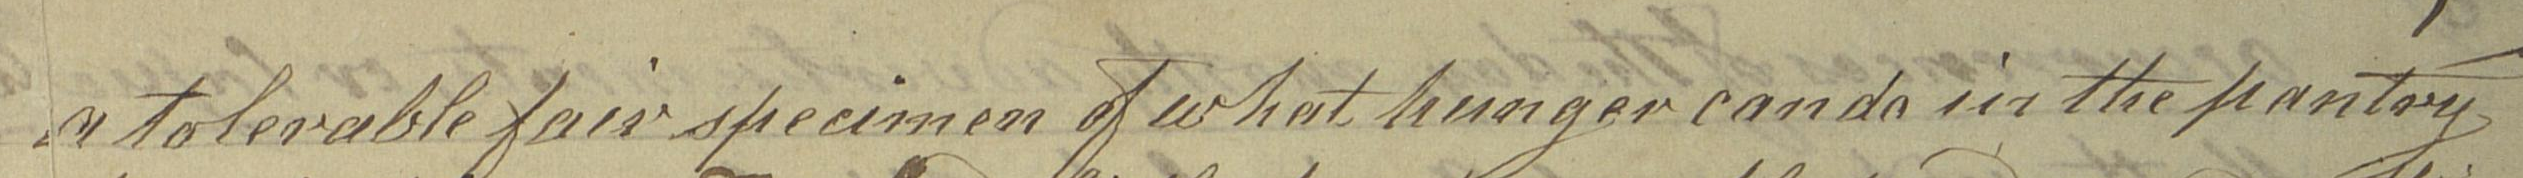a tolerable fair specimen of what hunger can do in the pantry
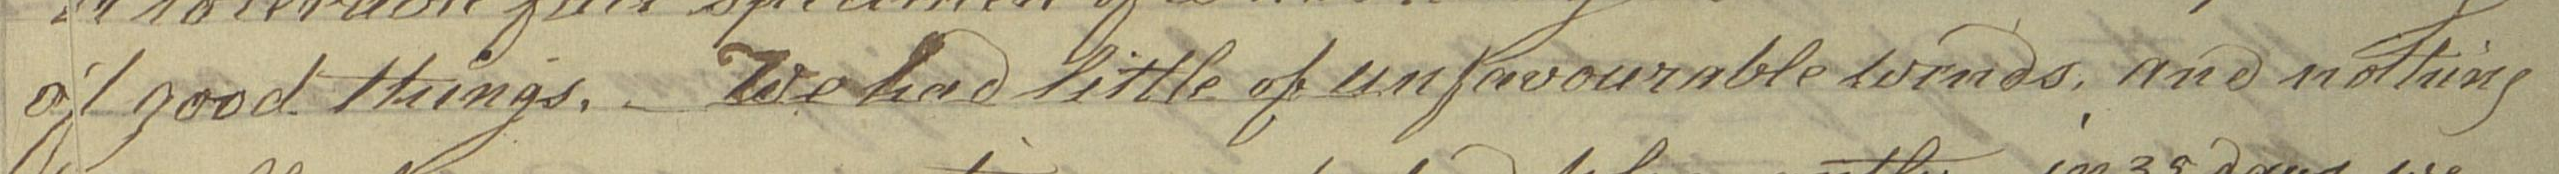of good things. We had little of unfavourable winds, and nothing
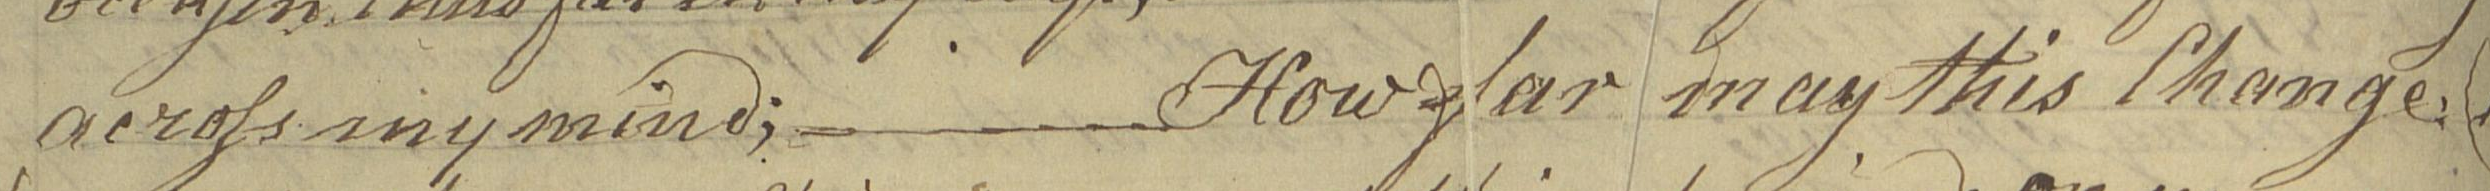across my mind; How far may this Change: (in
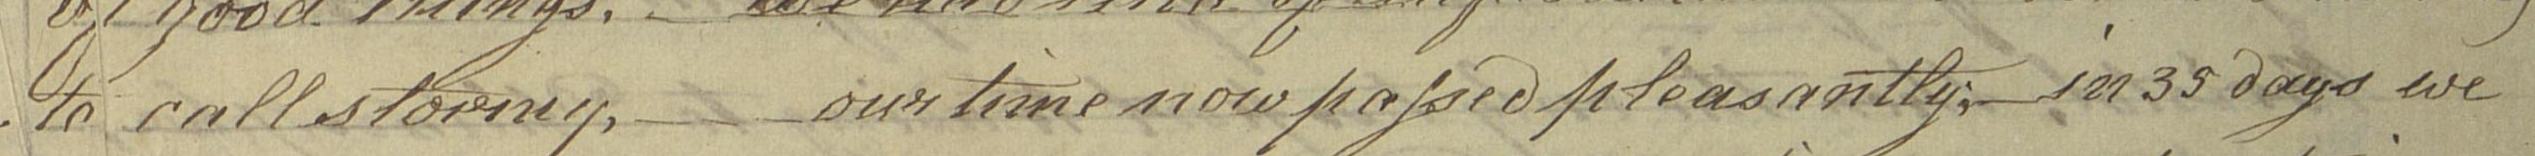to call stormy, our time now passed pleasantly; in 35 days we
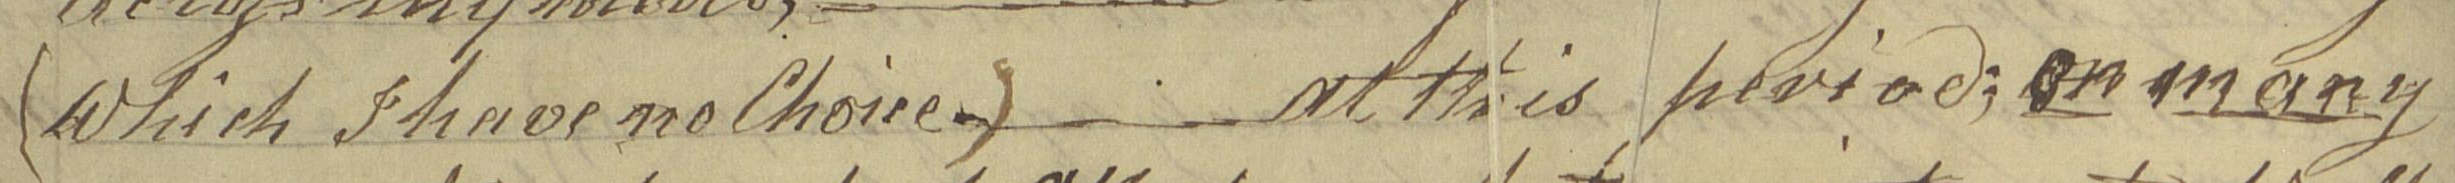(which I have no Choice) at this period; on many
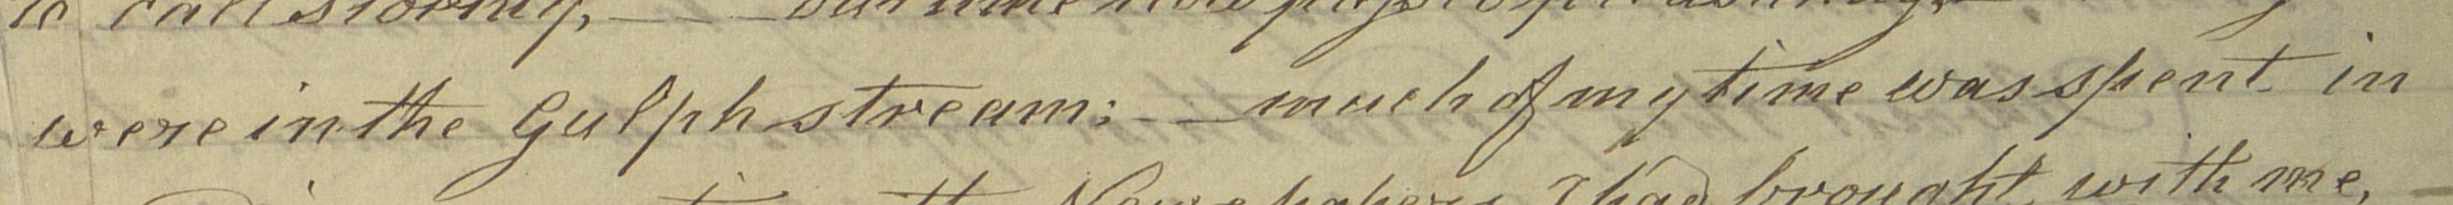were in the Gulph stream: much of my time was spent in
